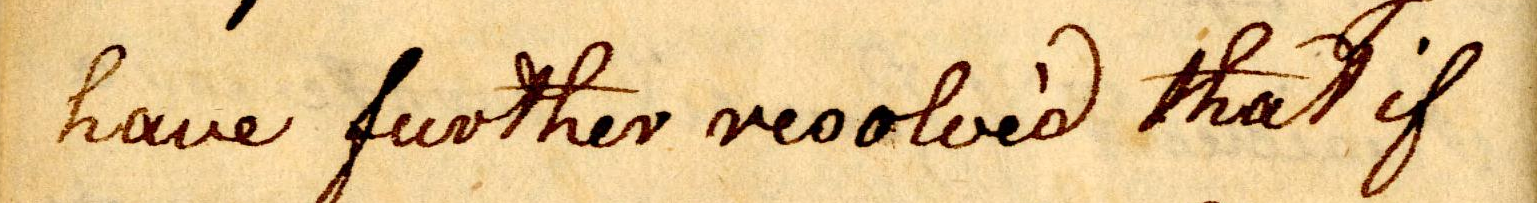have further resolve'd that if
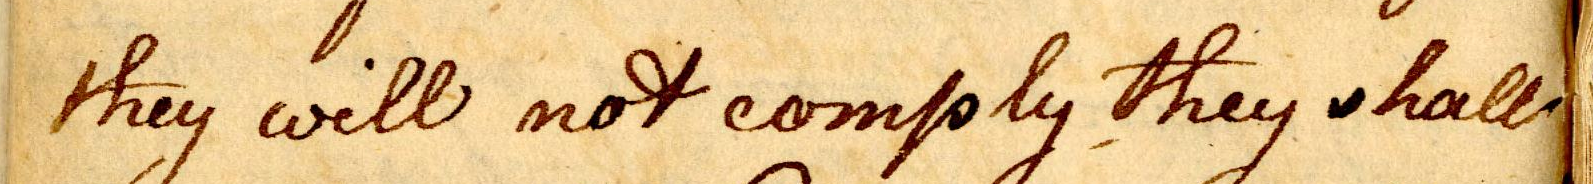they will not comply they shall
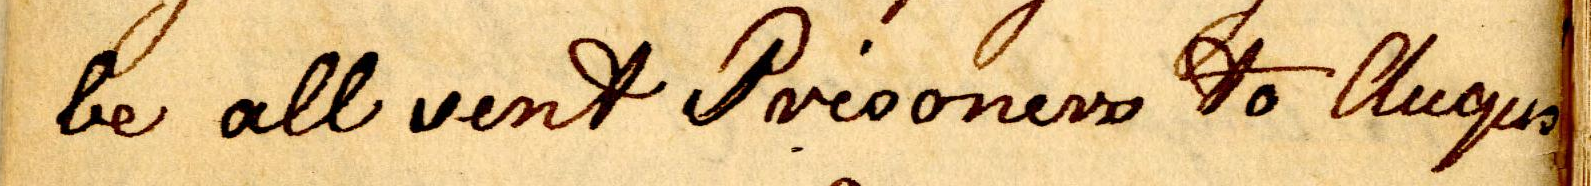be all sent Prisoners to Augus
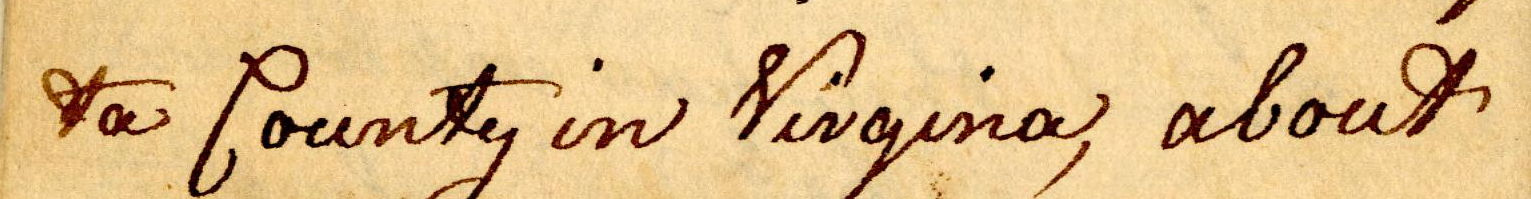to County in Virginia, about
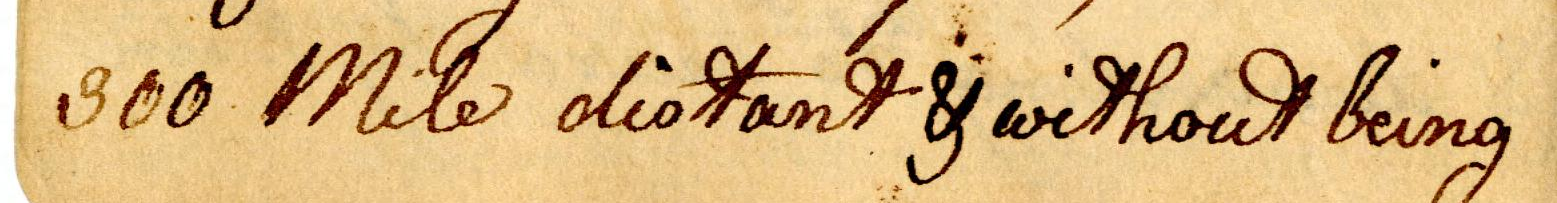300 Mile distant & without being
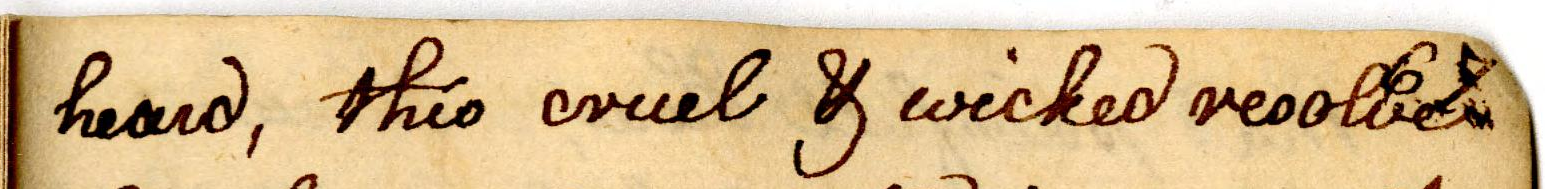heard, this cruel & wicked resolve
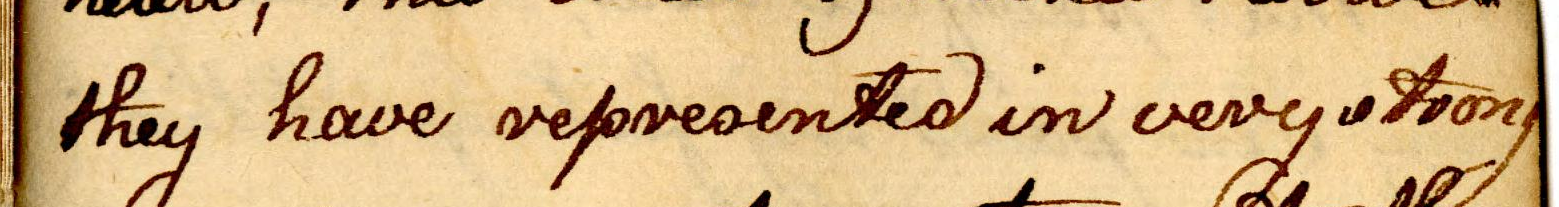they have represented in very strong
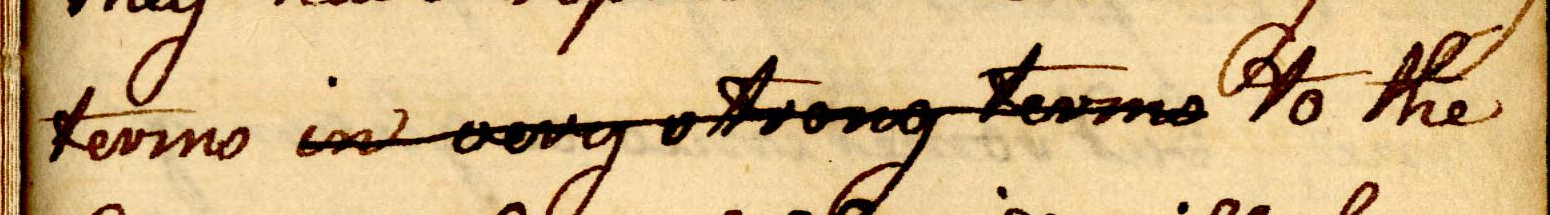terms [in very strong terms] to the
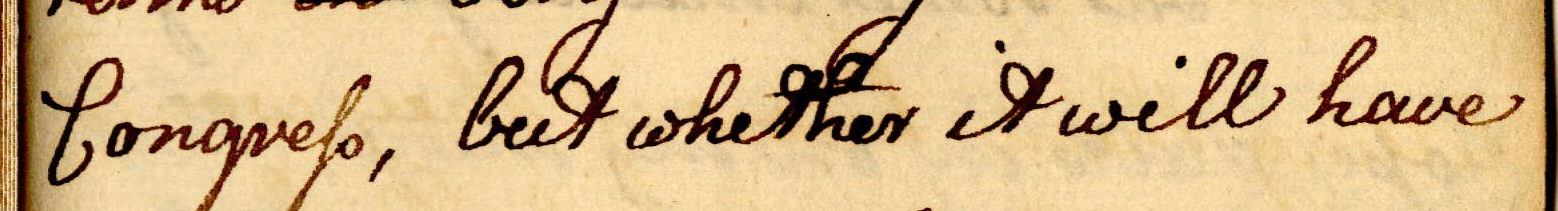Congress, but whether it will have
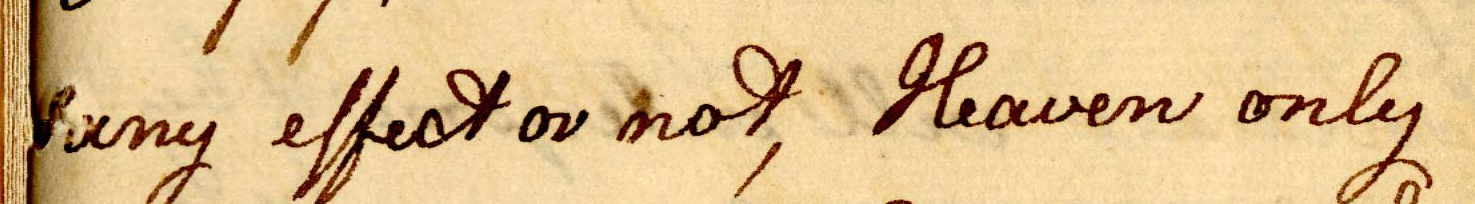any effect or not, Heaven only
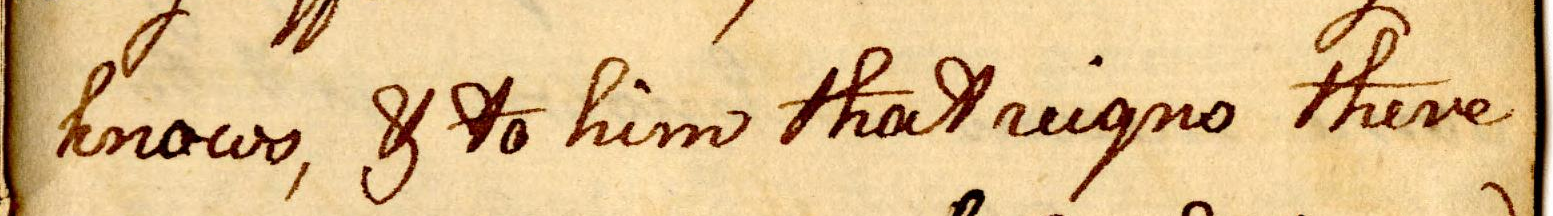knows, & to him that reigns there
